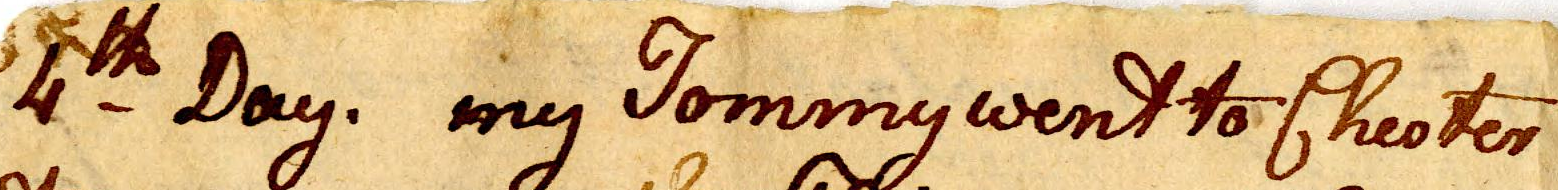4^th Day. my Tommy went to Chester
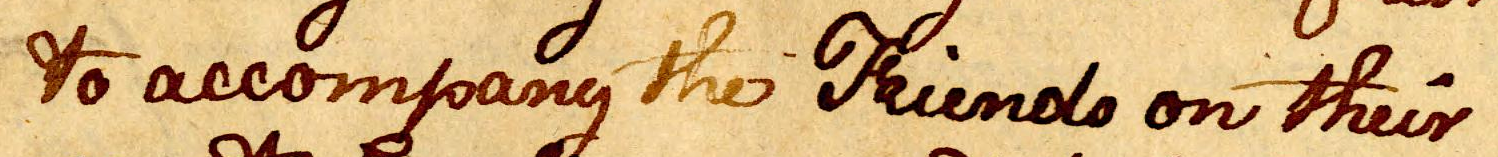to accompany the Friends on their
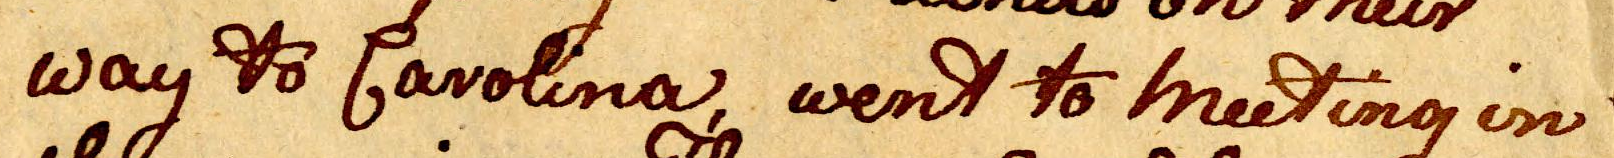way to Carolina, went to Meeting in
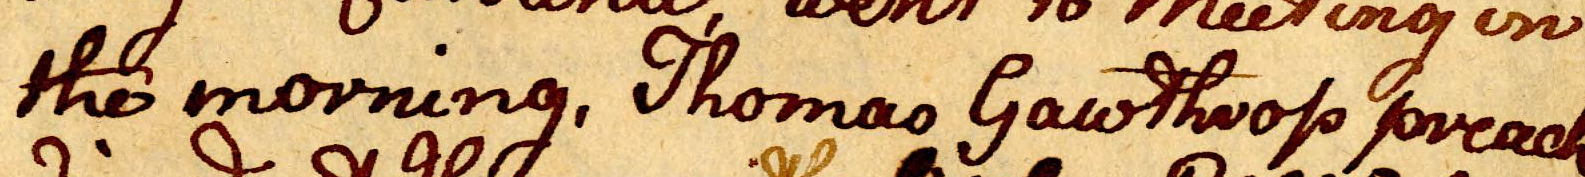the morning, Thomas Gawthrop preachd
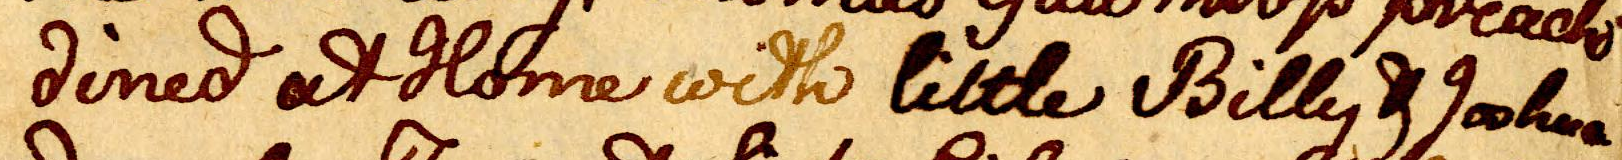dined at Home with little Billy & Joshua
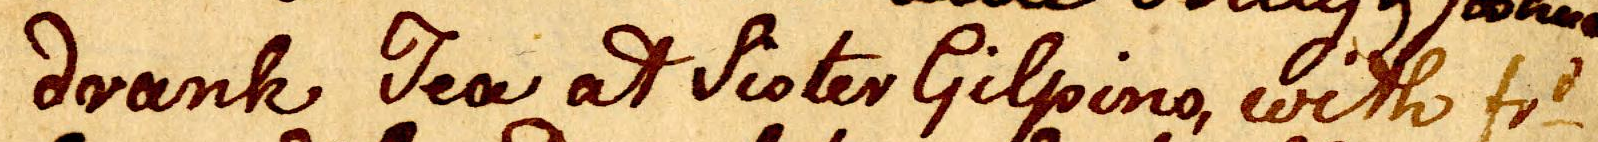drank Tea at Sister Gilpins, with Fr^d
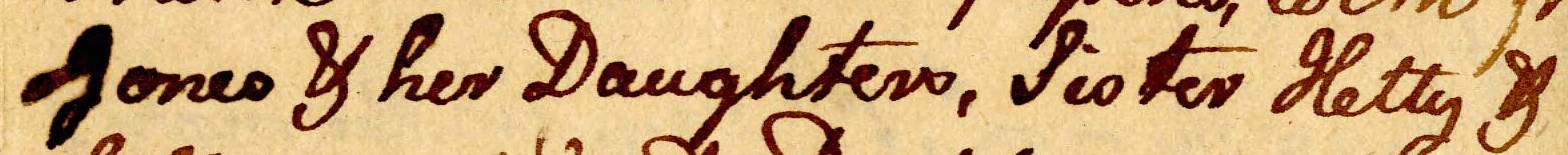Jones & her Daughter, Sister Hetty &
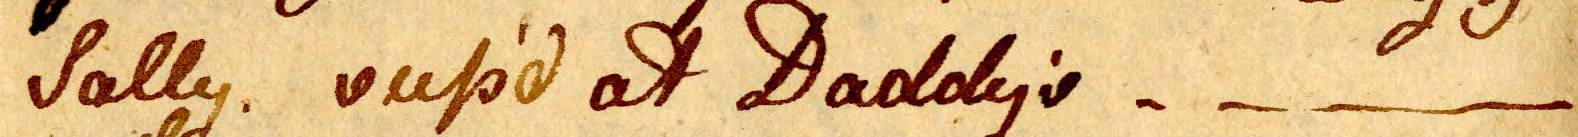Sally. sup'd at Daddy's--
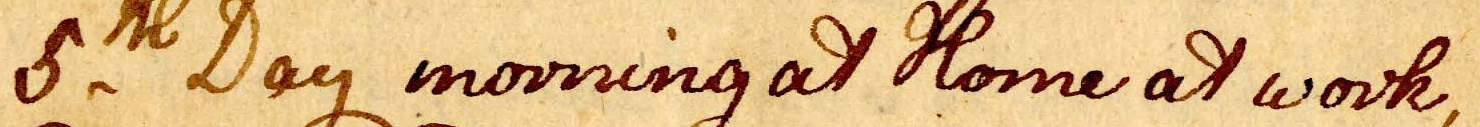5^th Day morning at Home at work,
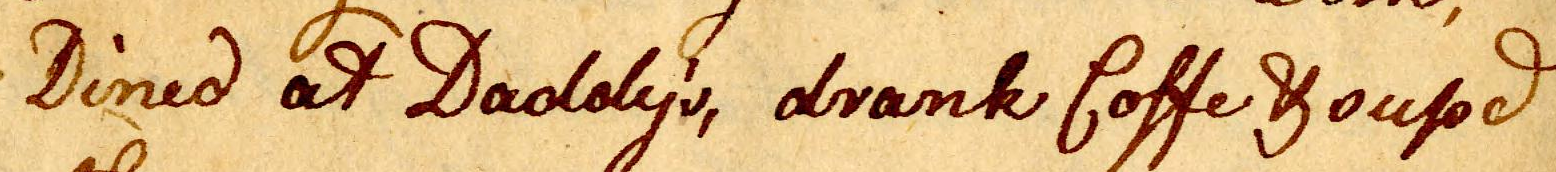Dined at Daddy's, drank Coffe & supd
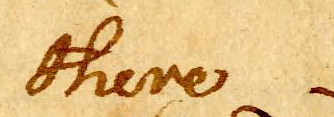there-
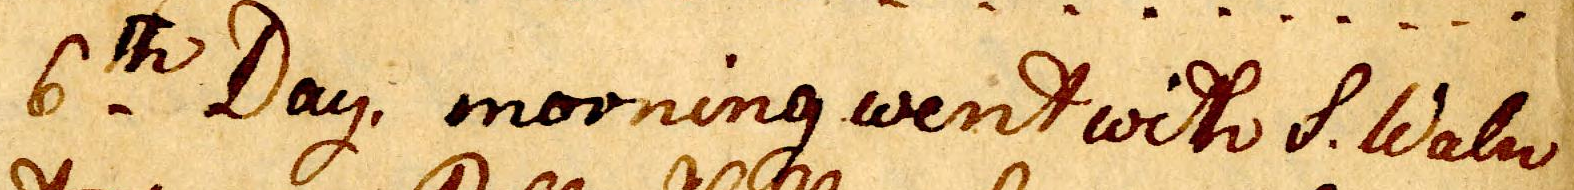6^th Day, morning went with S. Waln
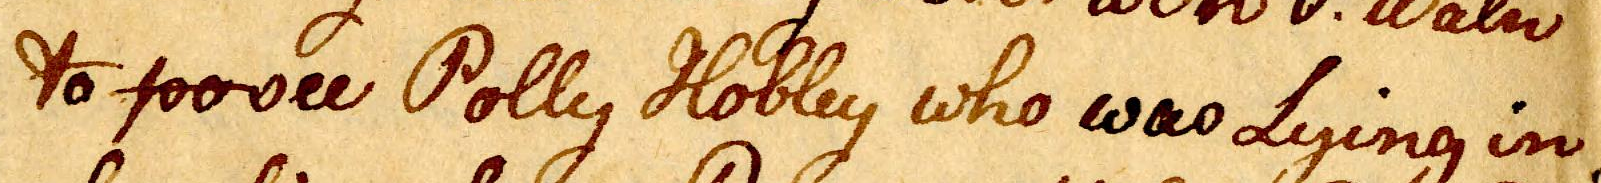to [__] see Polly Hobley who was Lying in
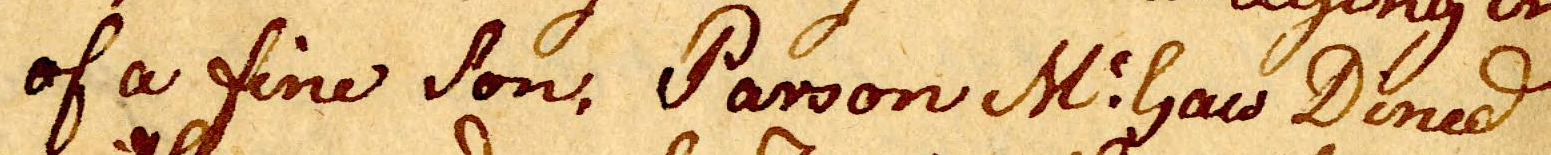of a fine Son, Parson M^c.Gaw Dined
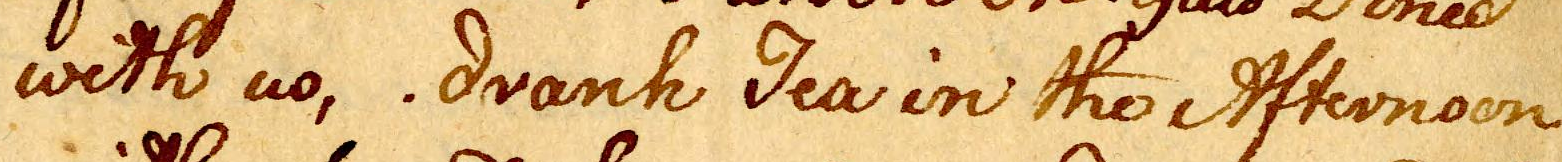with us, drank Tea in the Afternoon
